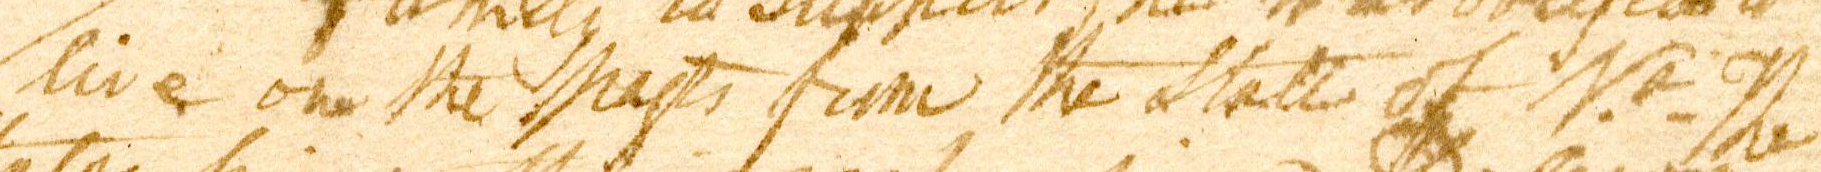live on the spats from the State of N^a
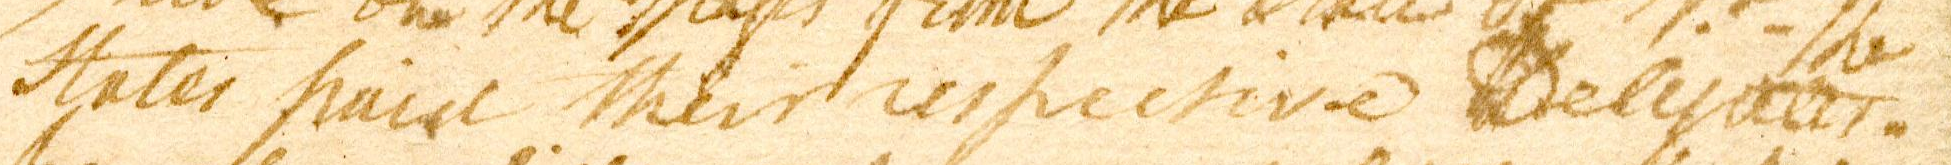States paid their respective Delegates
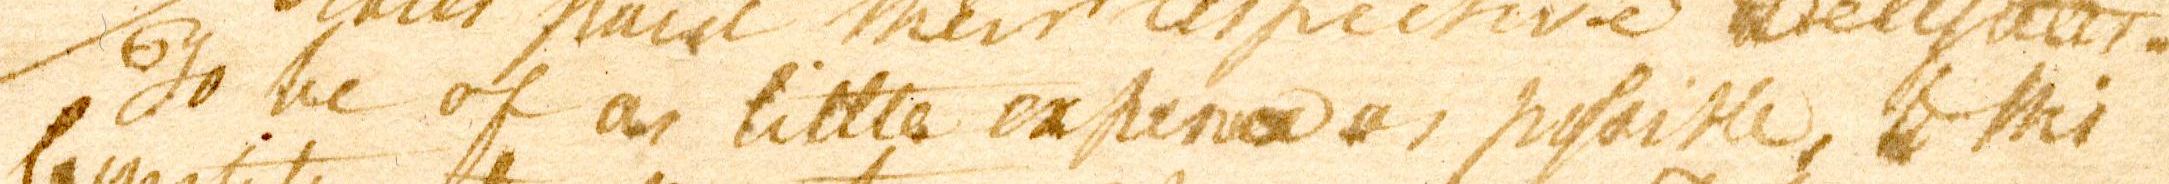To be of as little expence as possible, & this
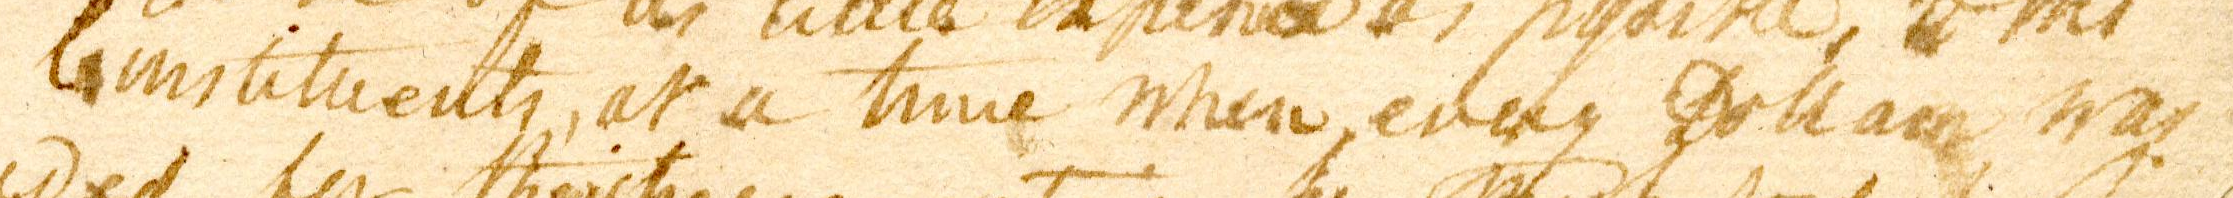Constituents, at a time when, every Dollar was
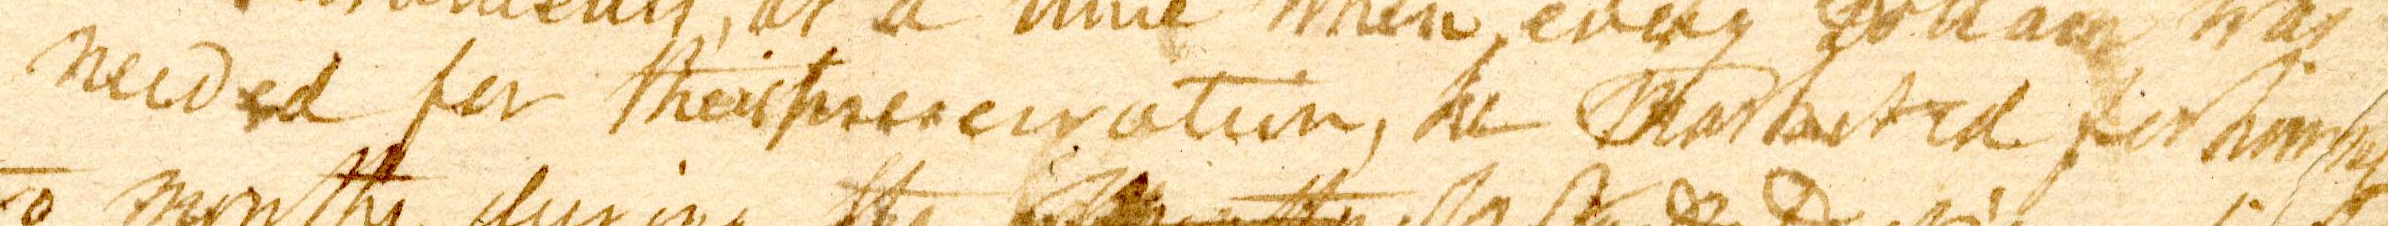needed for their preservation, he worked fer him
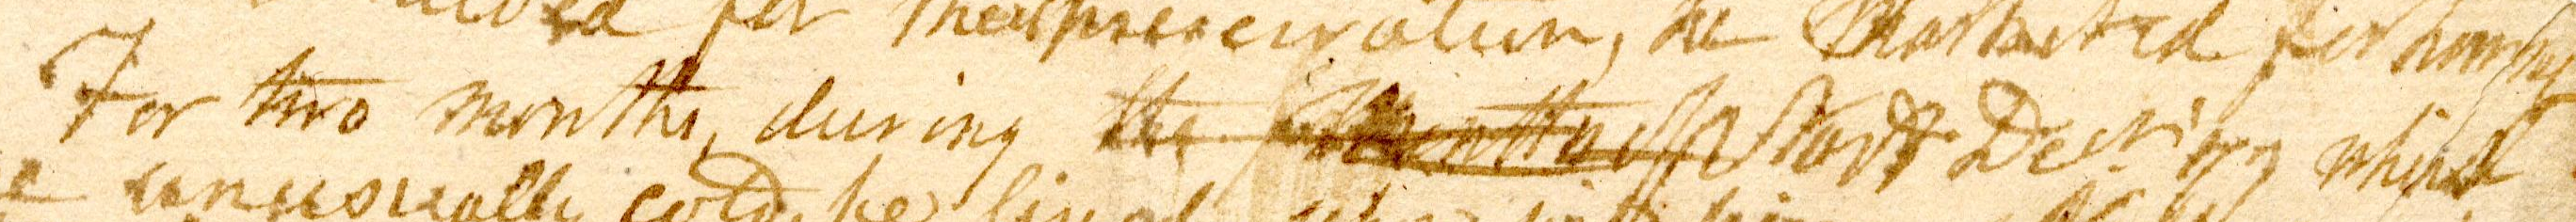For two months, during [__________] Nov & Dec^r '77 which
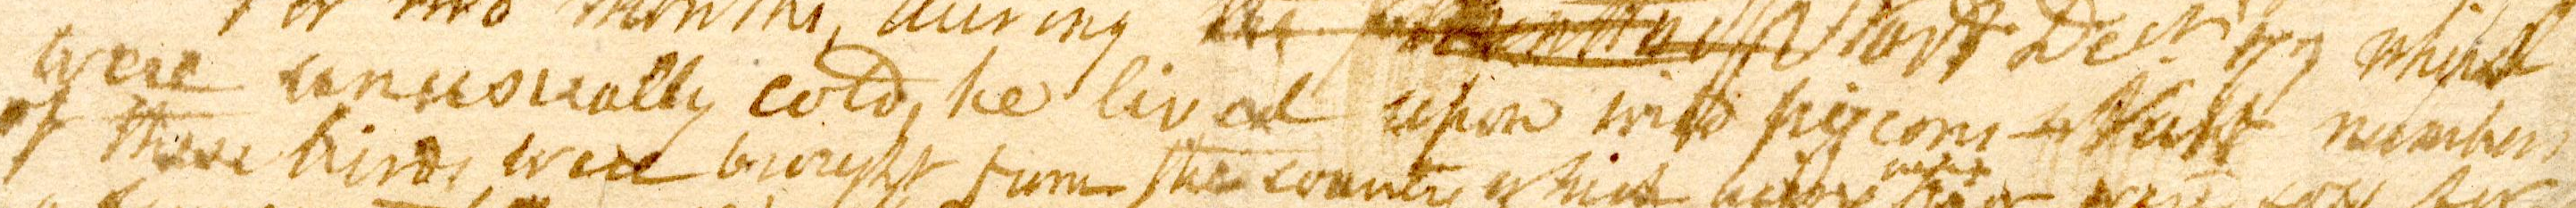were unusually cold, he lived upon his pigeons Half number
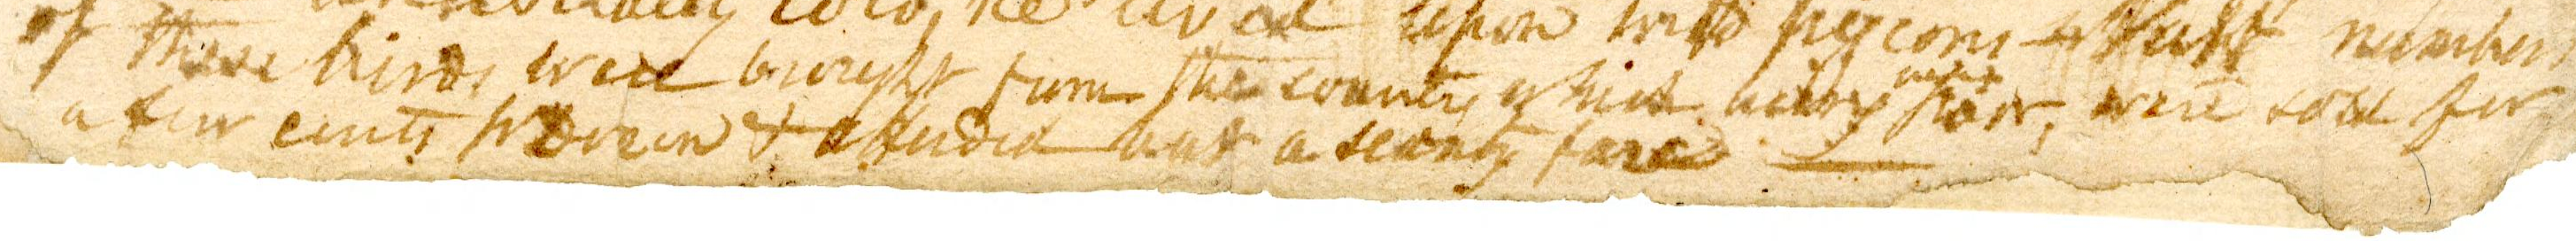of these birds were brought from the country which, being poor were sold for
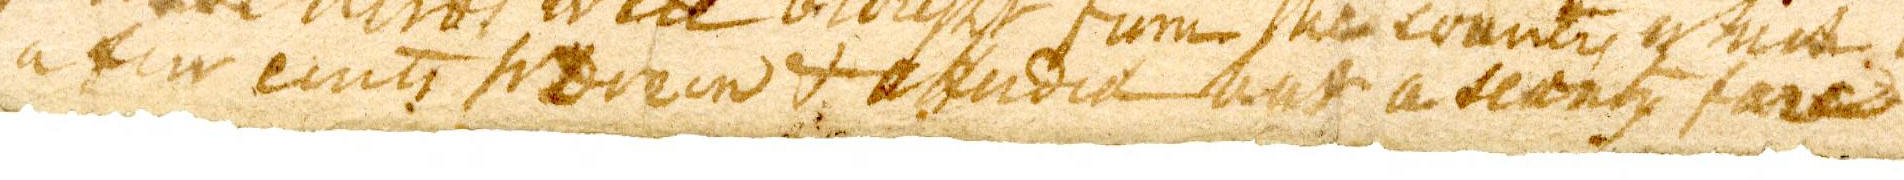a few cents p Dreen & a Headed- but a scanty face
